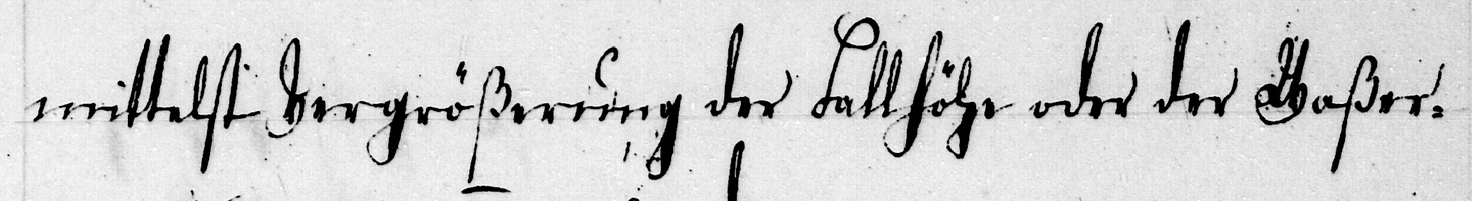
mittelst Vergrößerung der Fallhöhe oder der Waßer¬
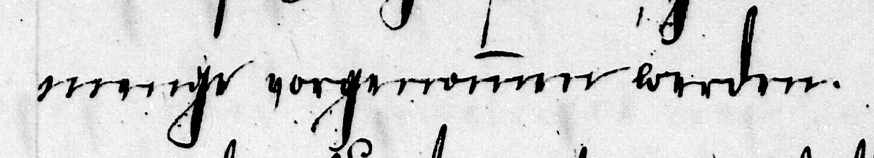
menge vorgenommen werden.
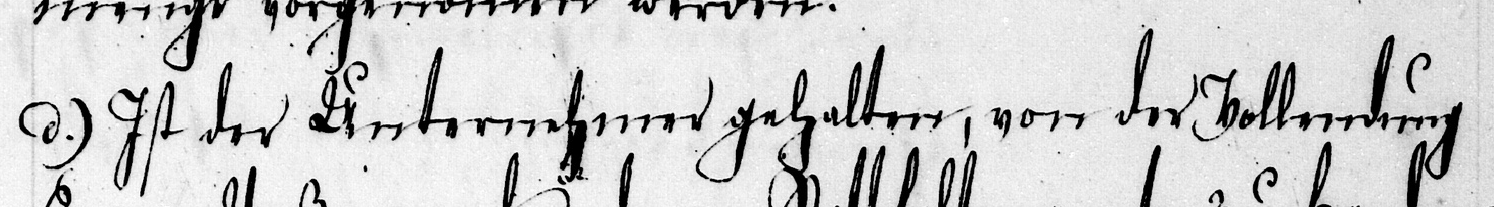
d.) Ist der Unternehmer gehalten, von der Vollendung
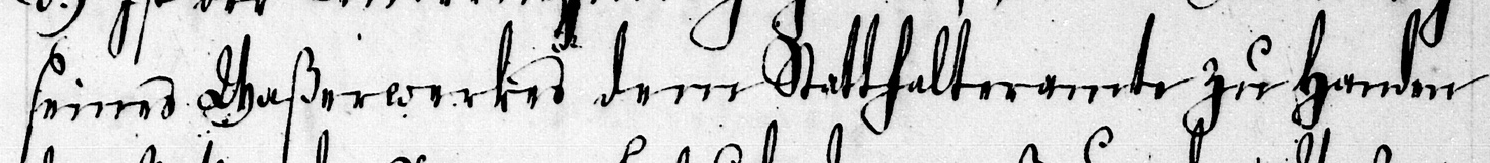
seines Waßerwerkes dem Statthalteramte zu Handen
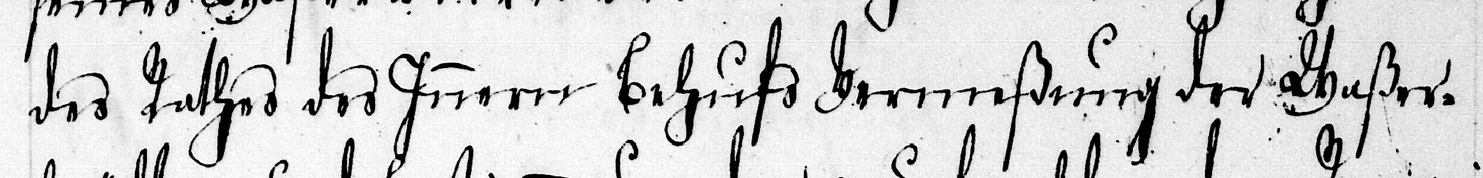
des Rathes des Innern Behufs Vermeßung der Waßer¬
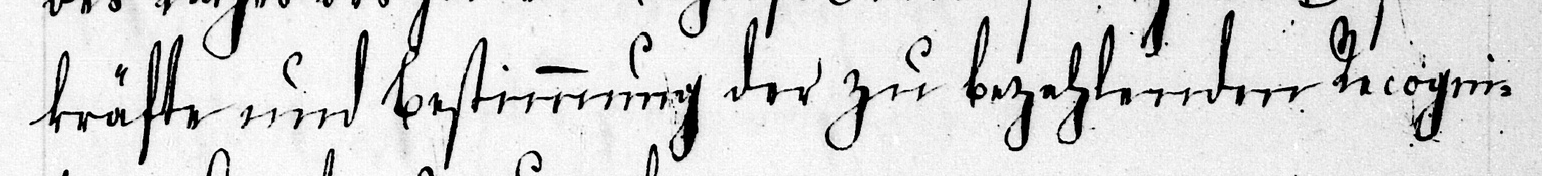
kräfte und Bestimmung der zu bezahlenden Recogni¬
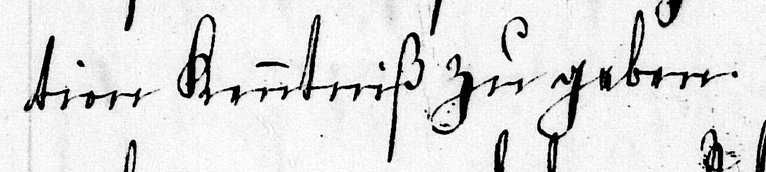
tion Kenntniß zu geben.
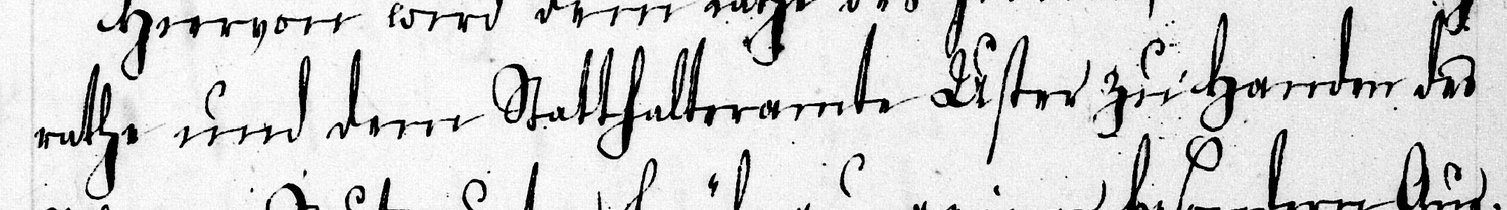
rathe und dem Statthalteramte Uster zu Handen des
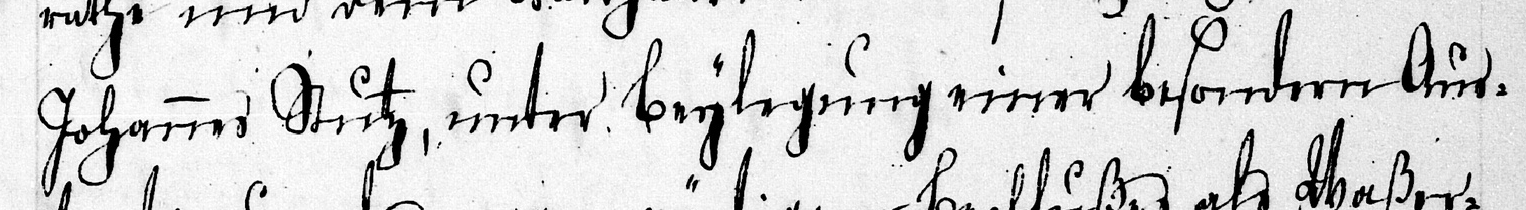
Johannes Stutz, unter Beylegung einer besondern Aus¬
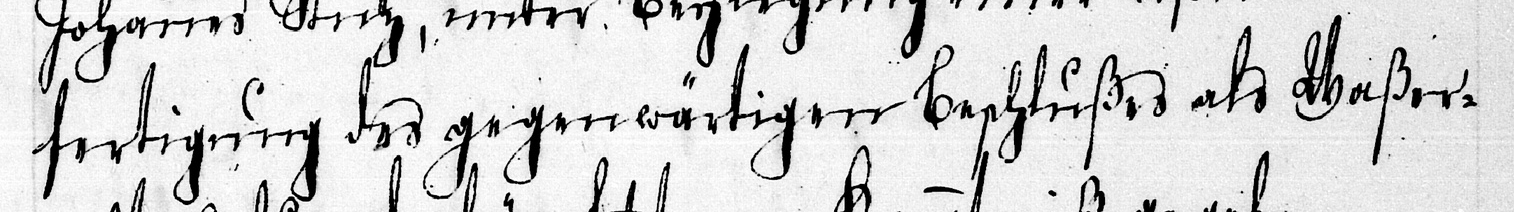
fertigung des gegenwärtigen Beschlußes als Waßer¬
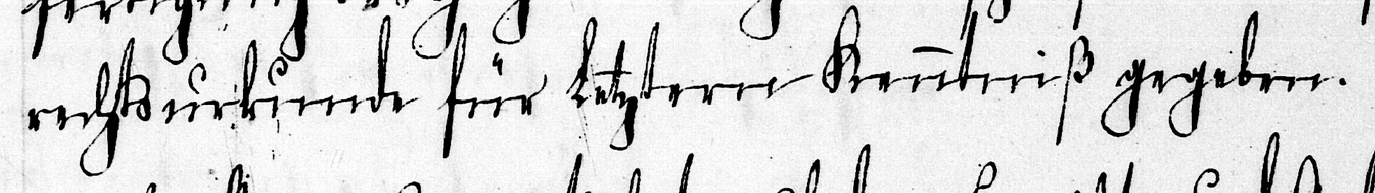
rechtsurkunde für Letztern Kenntniß gegeben.
